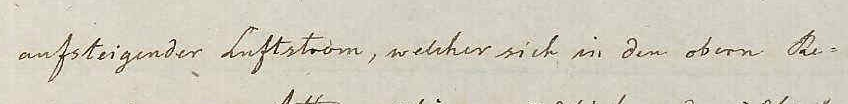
aufsteigender Luftstrom, welcher sich in den obern Re-
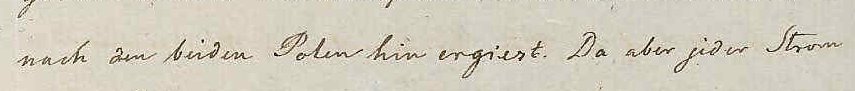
nach den beiden Polen hin ergiest. Da aber jeder Strom
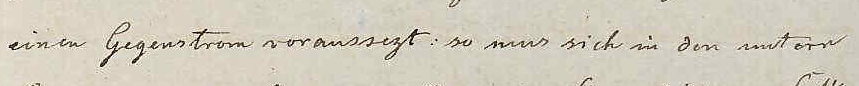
einen Gegenstrom voraussezt: so mus sich in den untern
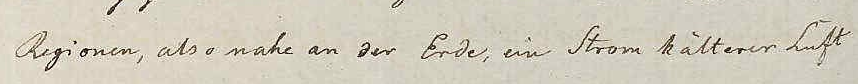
Regionen, also nahe an der Erde, ein Strom kälterer Luft
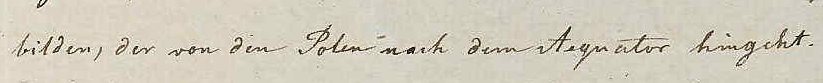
bilden, der von den Polen nach dem Aequator hingeht.
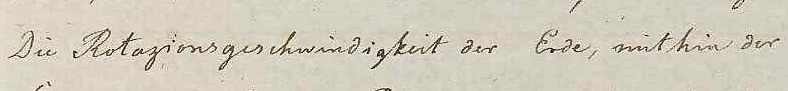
Die Rotazionsgeschwindigkeit der Erde, mithin der
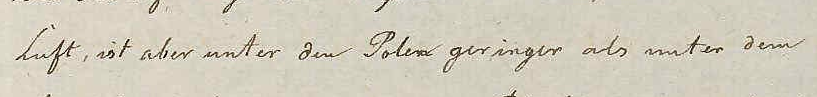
Luft, ist aber unter den Polen geringer als unter dem
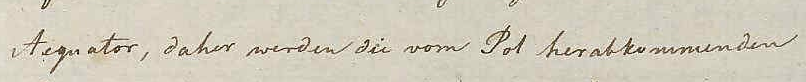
Aequator, daher werden die vom Pol herabkommenden
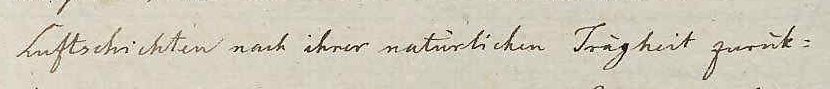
Luftschichten nach ihrer natürlichen Trägheit zurük-
